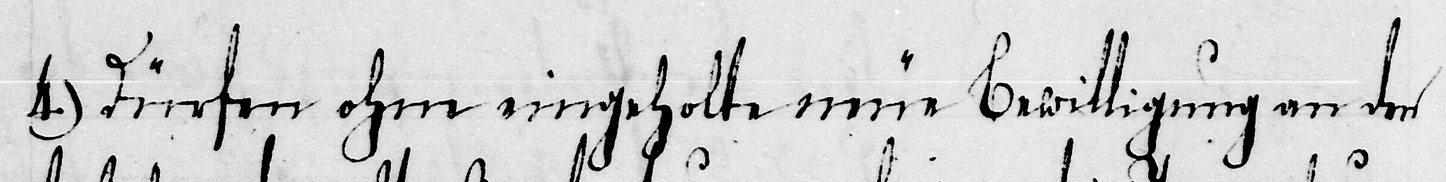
4.) Dürfen ohne eingeholte neue Bewilligung an den
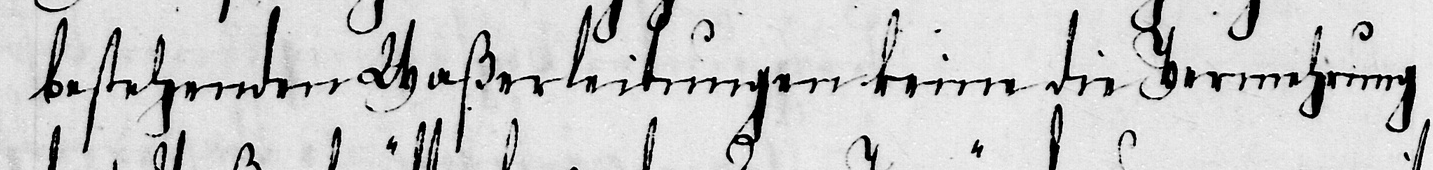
bestehenden Waßerleitungen keine die Vermehrung
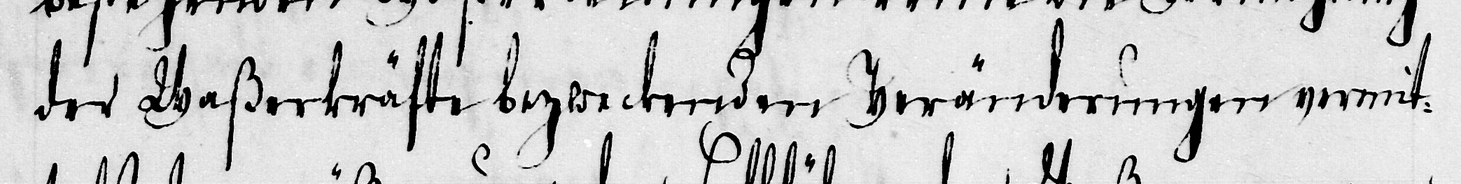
der Waßerkräfte bezweckenden Veränderungen vermit¬
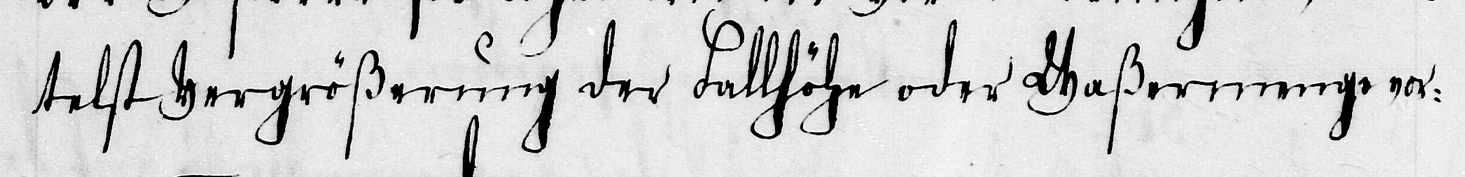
telst Vergrößerung der Fallhöhe oder Waßermenge vor¬
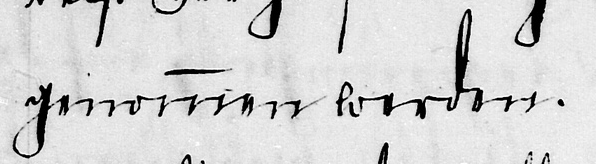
genommen werden.
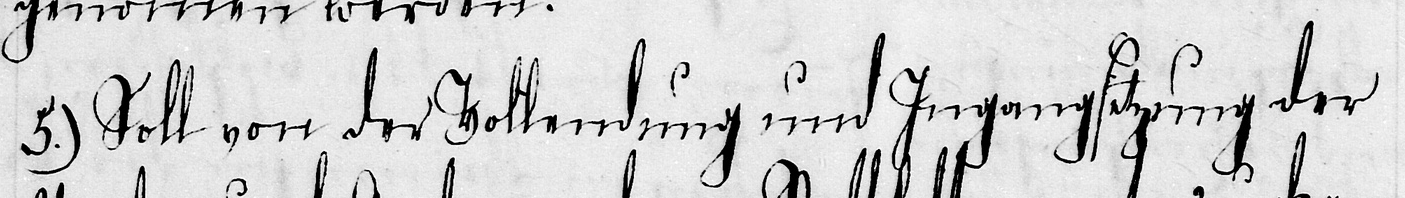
5.) Soll von der Vollendung und Ingangsetzung der
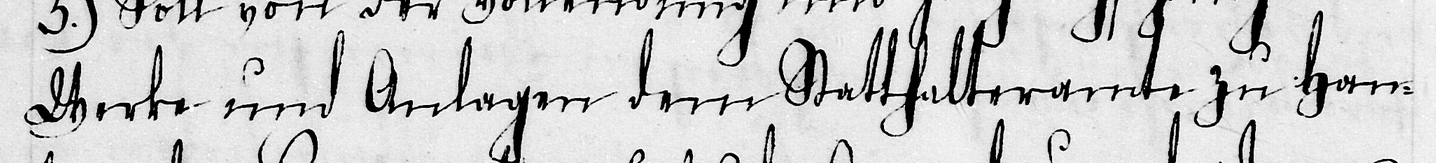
Werke und Anlagen dem Statthalteramte zu Han¬
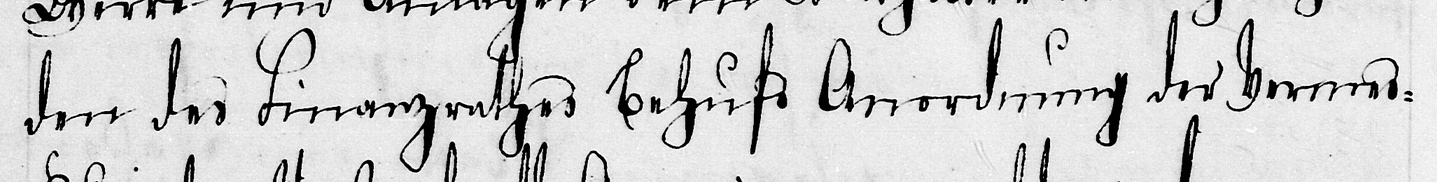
den des Finanzrathes Behufs Anordnung der Vermeß¬
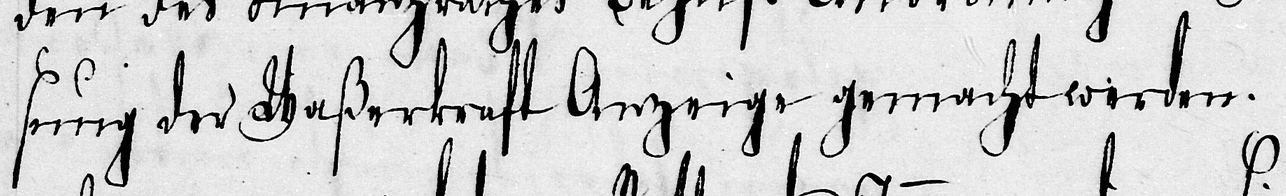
ung der Waßerkraft Anzeige gemacht werden.
